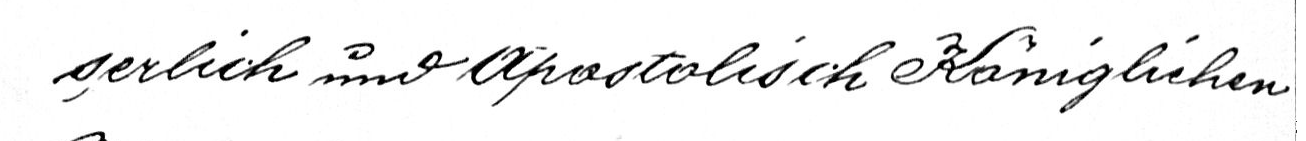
serlich und Apostolisch Königlichen
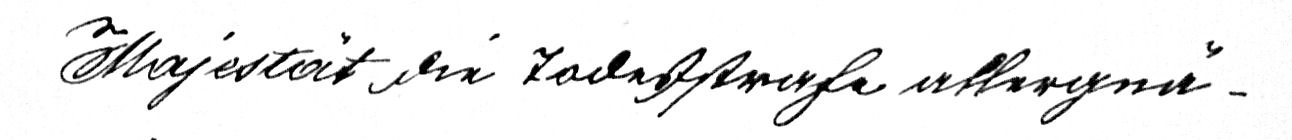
Majestät die Todesstrafe allergnä¬
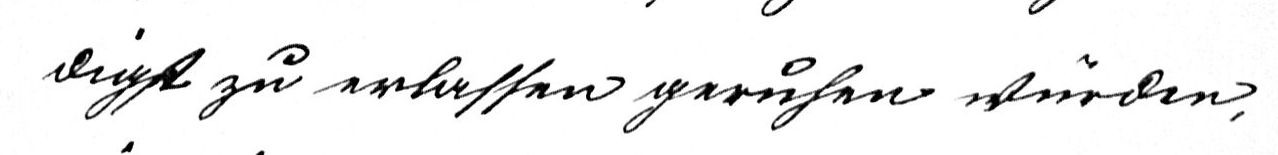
digst zu erlassen geruhen würden,
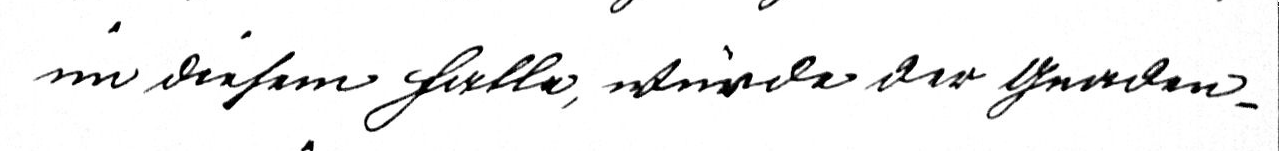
im diesem falle, würde der Gnaden¬
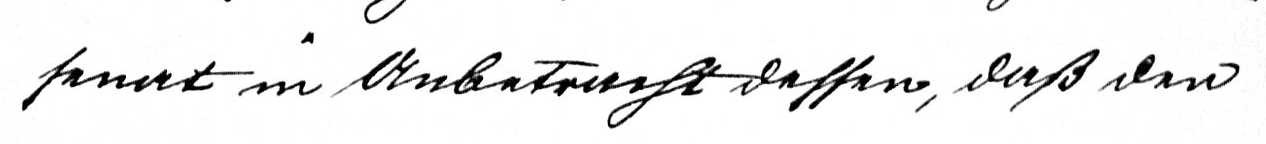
senat in Anbetracht dessen, daß den
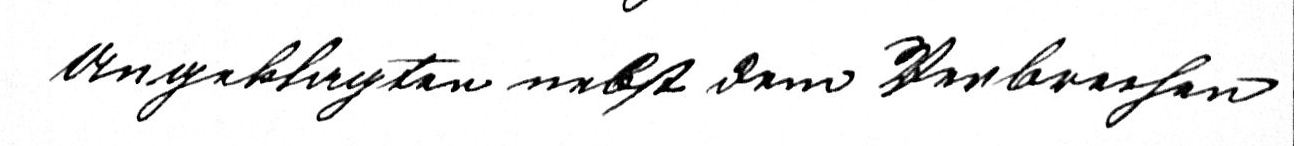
Angeklagten nebst dem Verbrechen
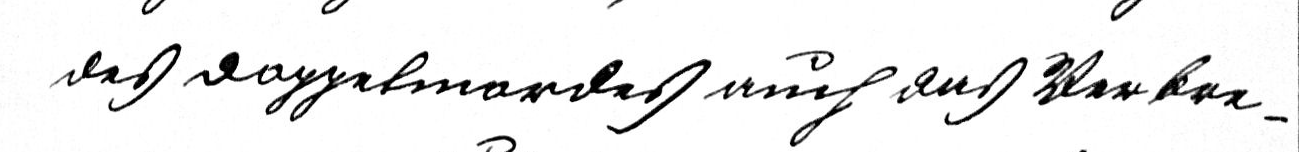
des Doppelmordes auch das Verbre¬
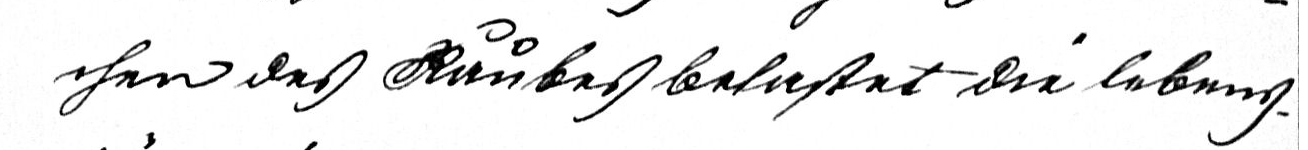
chen des Raubes betastet die lebens¬
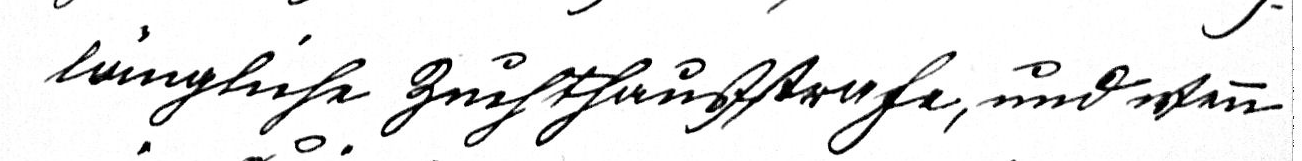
längliche Zuchthausstrafe, und wenn
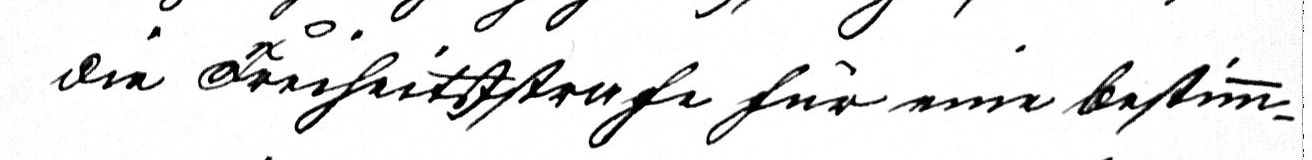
die Freiheitsstrafe für eine bestimm¬
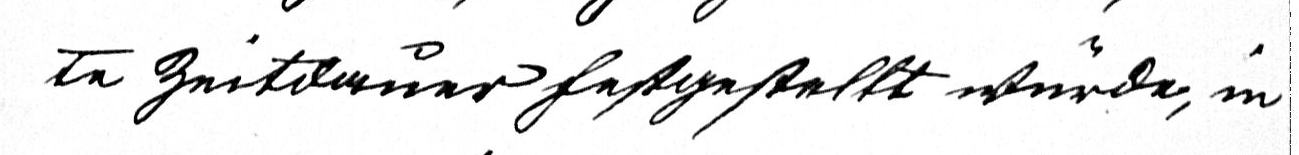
te Zeitdauer festgestellt würde, in
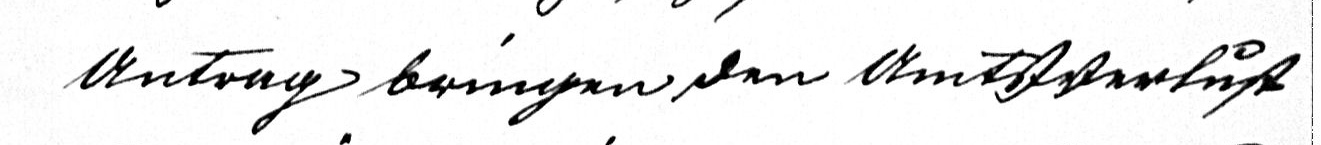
Antrag bringen den Amtsverlust
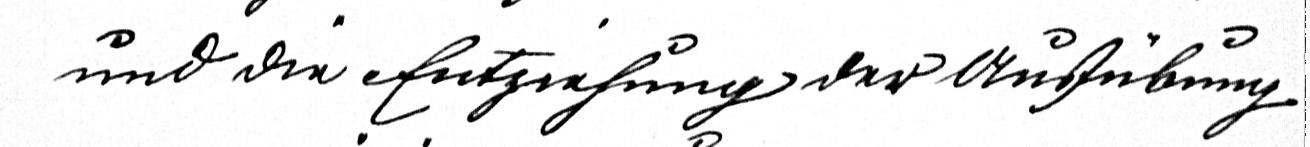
und die Entziehung der Ausübung
